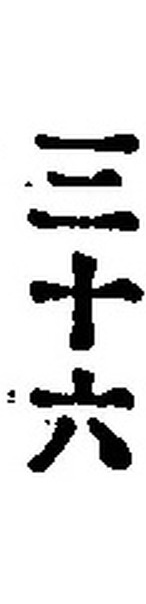三十六
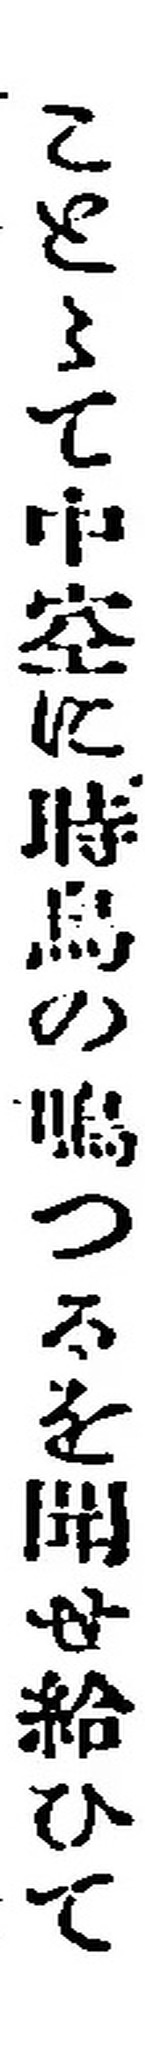ことゝて中空に時鳥の鳴つるを聞せ給ひて
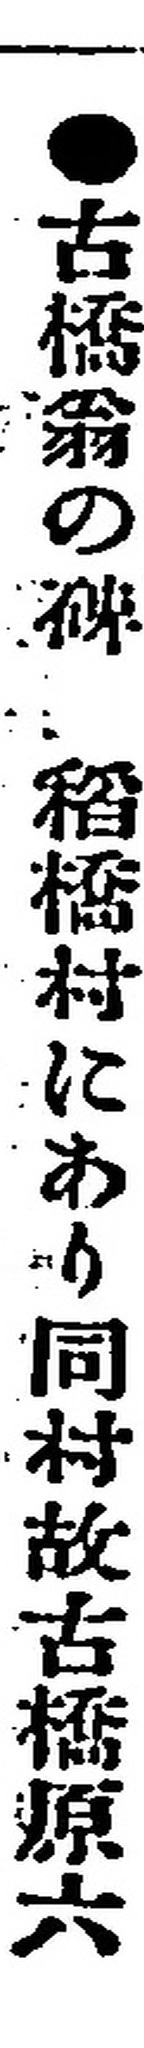●古橋翁の碑稲橋村にあり同村故古橋原六
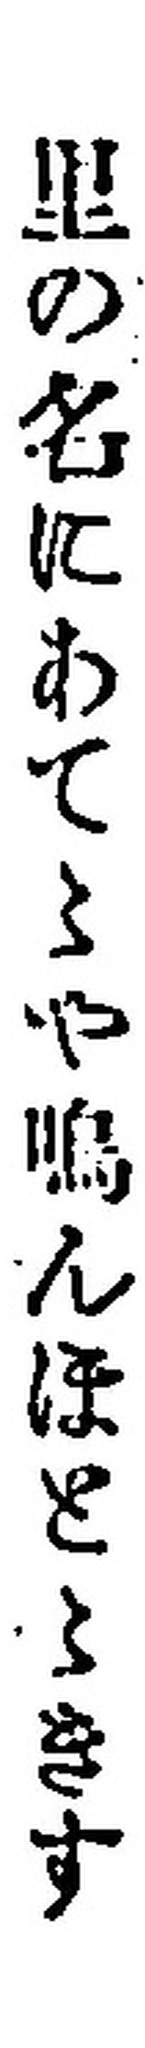里の名にあてゝや鳴んほとゝきす
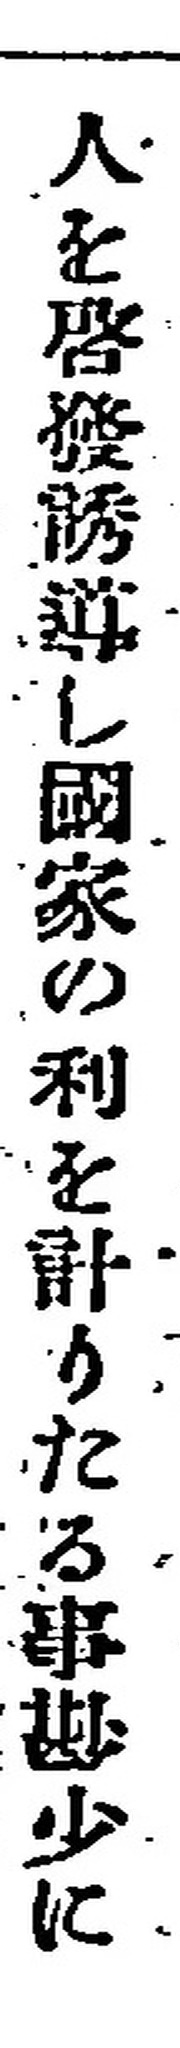人を啓発誘導し国家の利を計りたる事尠少に
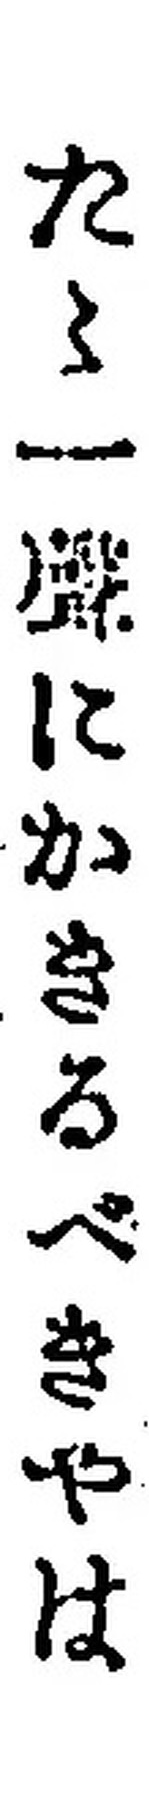たゝ一声にかきるべきやは
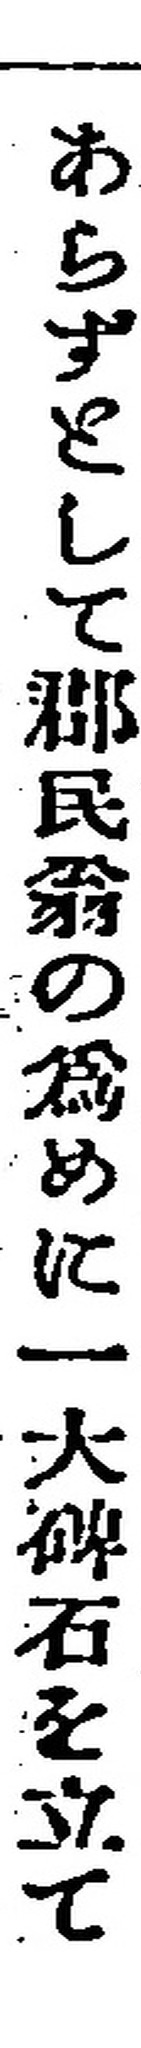あらずとして群民翁の為めに一大碑石を立て
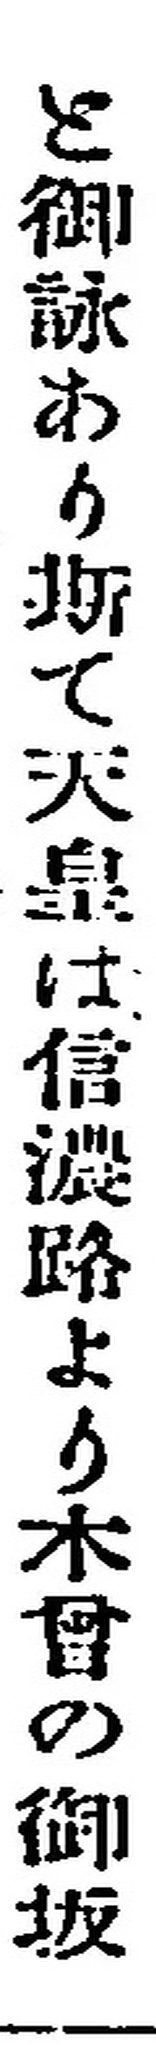と御詠あり斯て天皇は信濃路より木曽の御坂
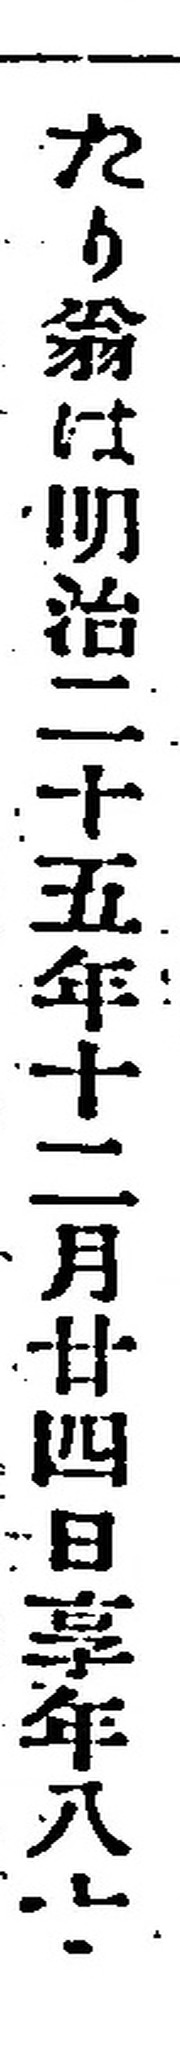たり翁は明治二十五年十二月廿四日享年八十
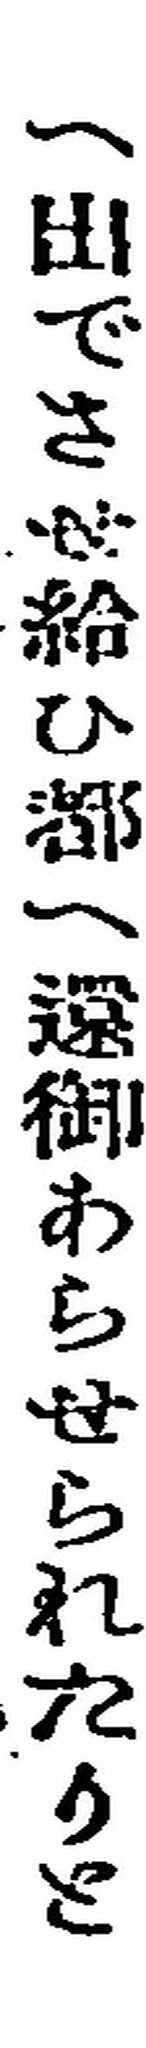へ出でさせ給ひ都へ還御あらせられたりと
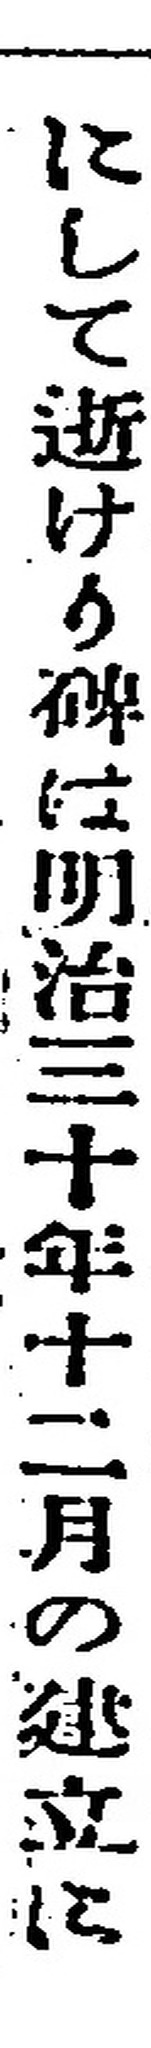にして逝けり碑は明治三十年十二月の建立に
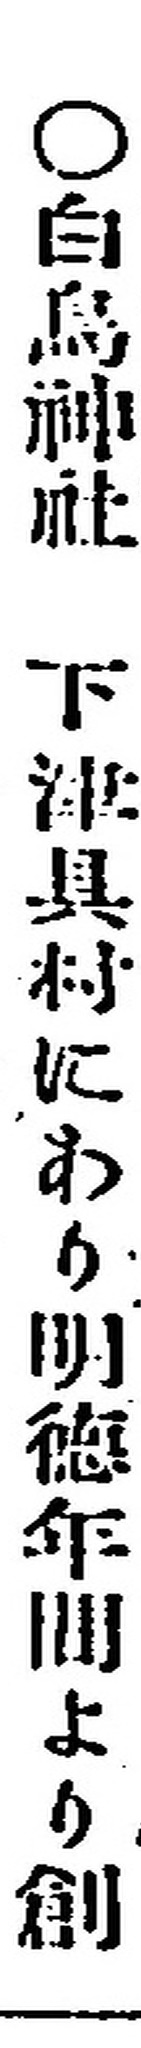○白鳥神社下津具村にあり明徳年間より創
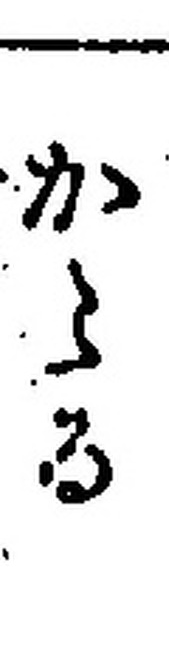かゝる
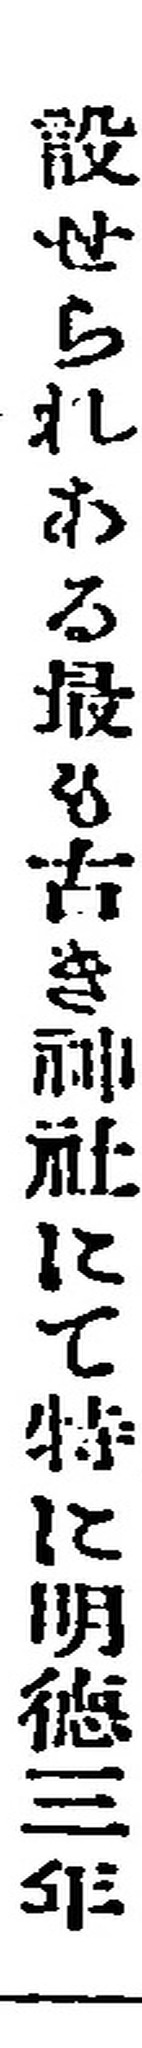設せられある最も古き神社にて特に明徳三年
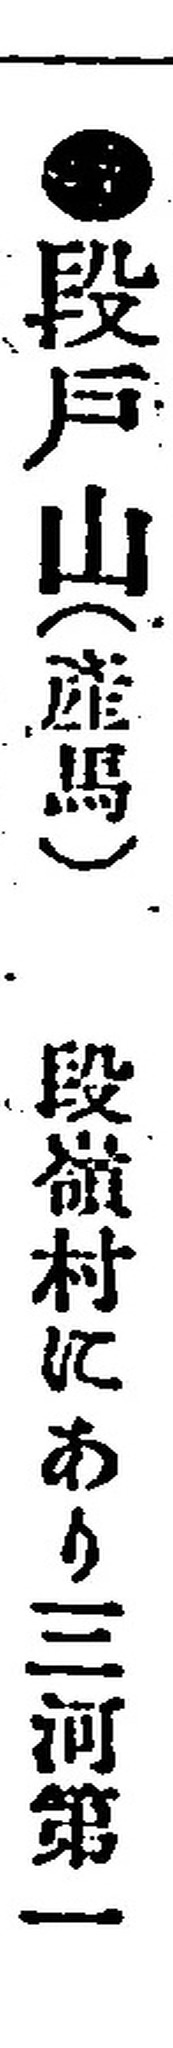●段戸山(産馬)段嶺村にあり三河第一
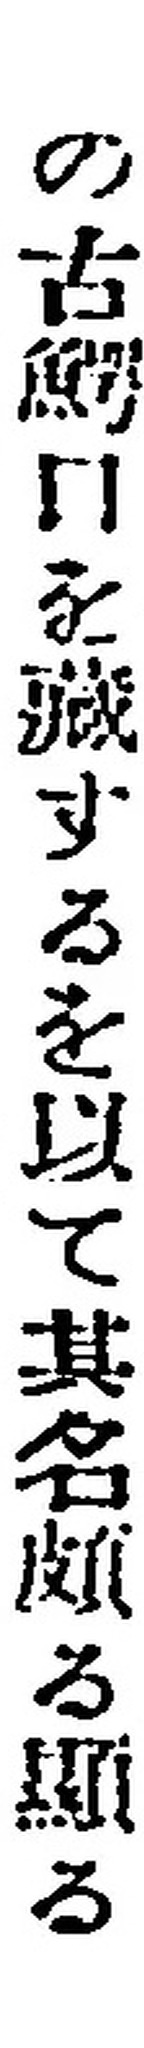の古鰐口を蔵するを以て其名頗る顕る
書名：東参名勝案内
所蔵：国立国会図書館 National Diet Library, JAPAN
